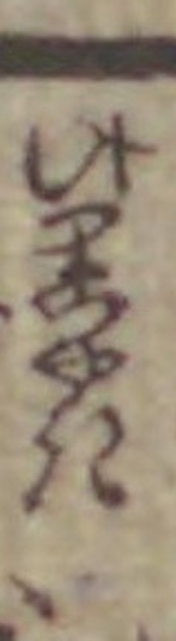此黒やき
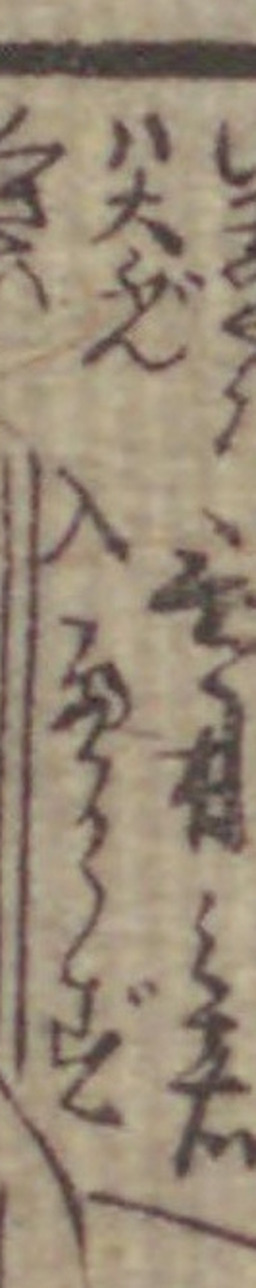くさい
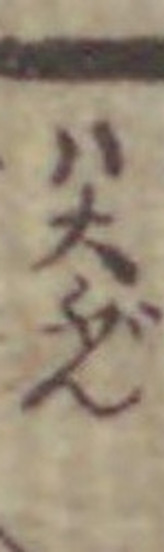は大ぶん
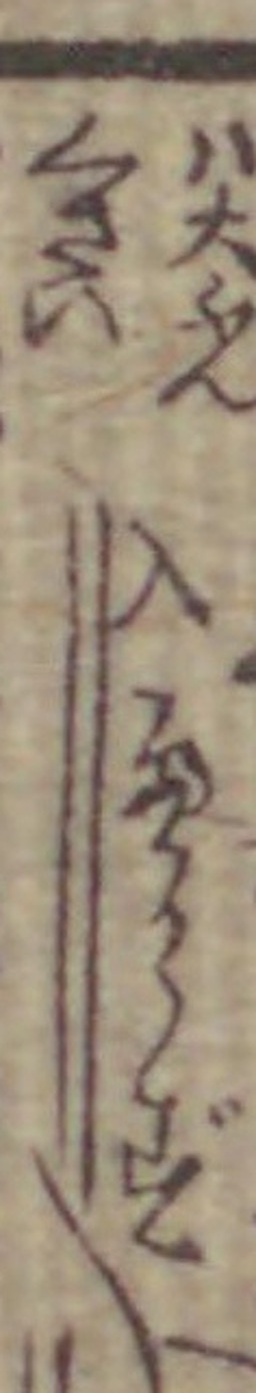くさい
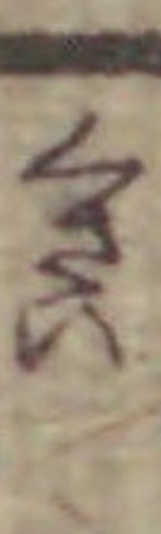くさい
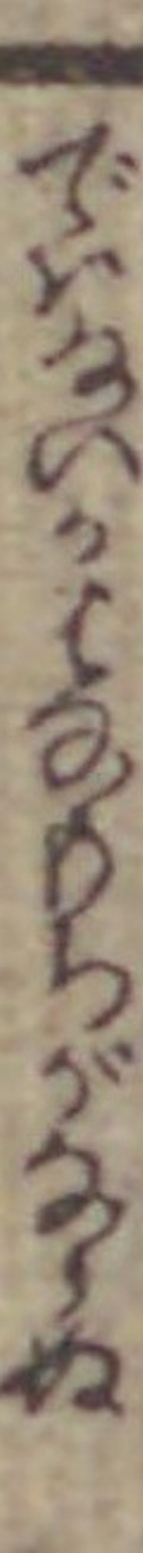ではないかはなもちがならぬ
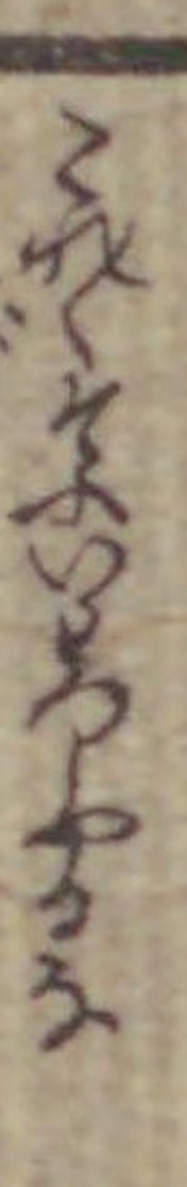これ〳〵そういわつしやるな
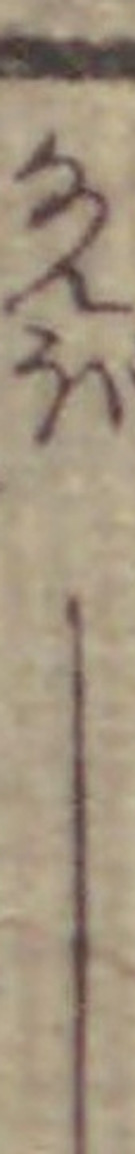なんぼ
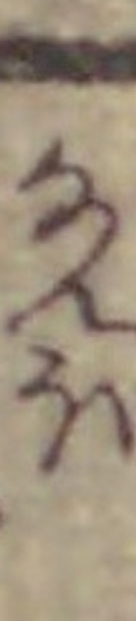なんぼ
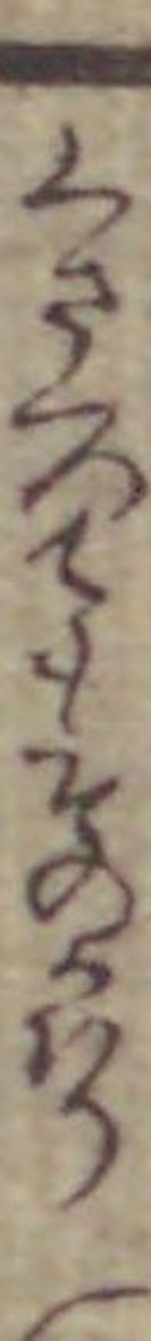くさくつてもそのかはり
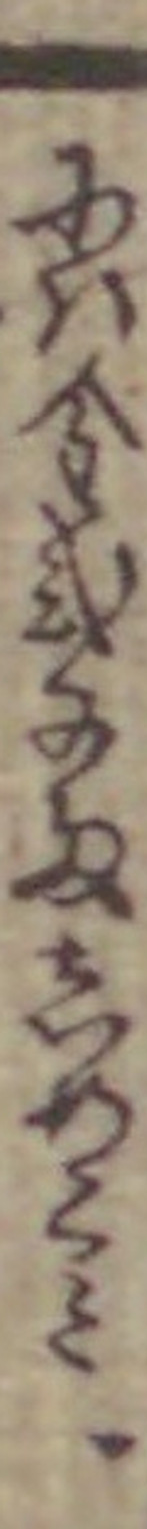には金二千両しめこみ
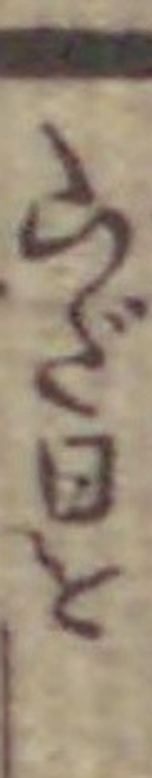山だ日を
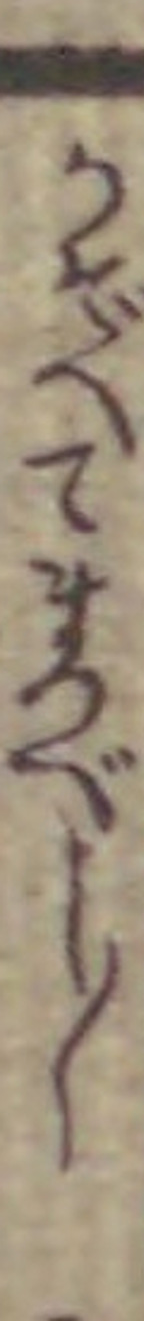かぞへてまつべし〳〵
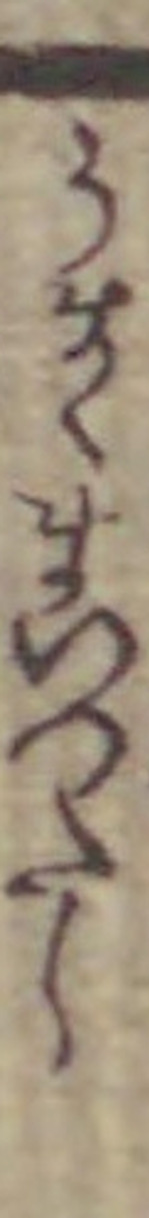うまくまいつたら
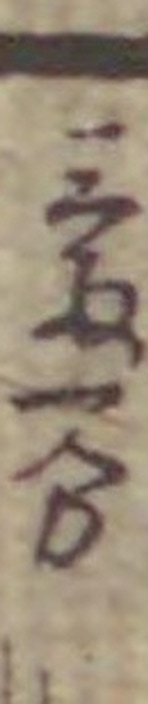三両一分
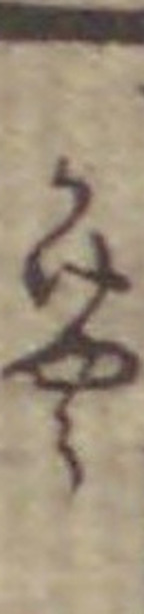かけやう
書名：止而道致虚録 3巻
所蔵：国立国会図書館 National Diet Library, JAPAN
